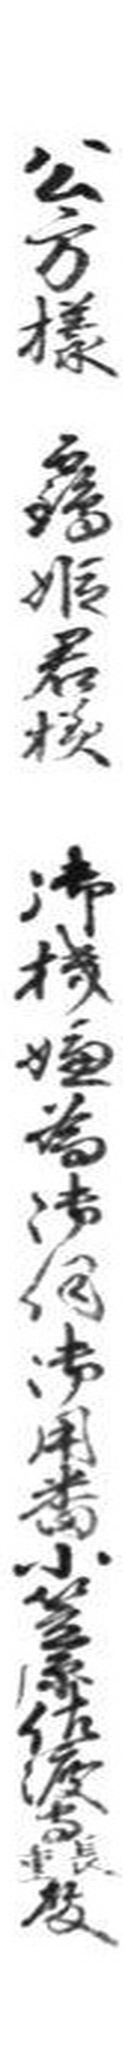公方様鶴姫君様御機嫌為御伺御用番小笠原佐渡守長重殿
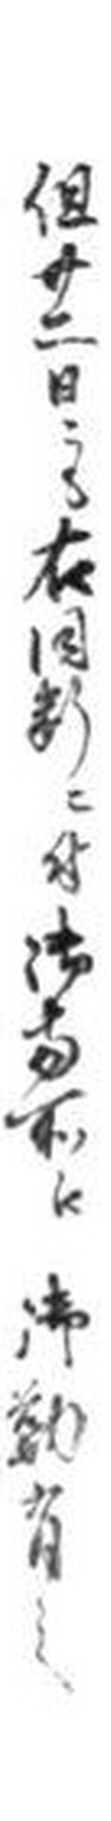但廿二日二も右同断ニ付御両所江御勤有之
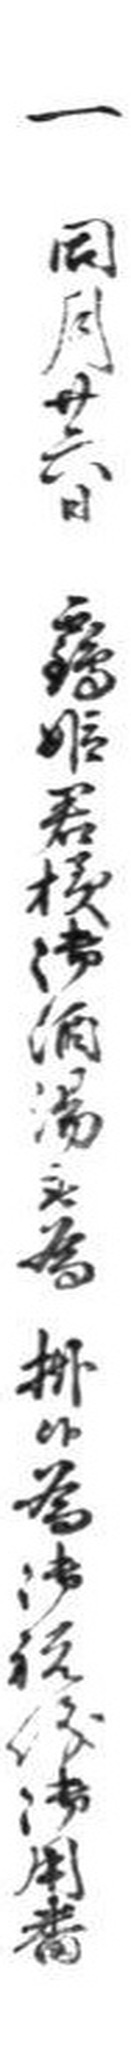一同月廿六日鶴姫君様御酒湯被為掛為御祝儀御用番
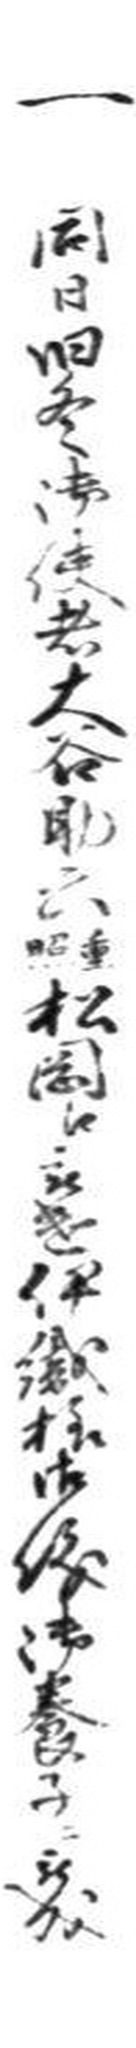一同日旧冬御使者大谷助六重照松岡江被遣伊織様御儀御養子ニ被成
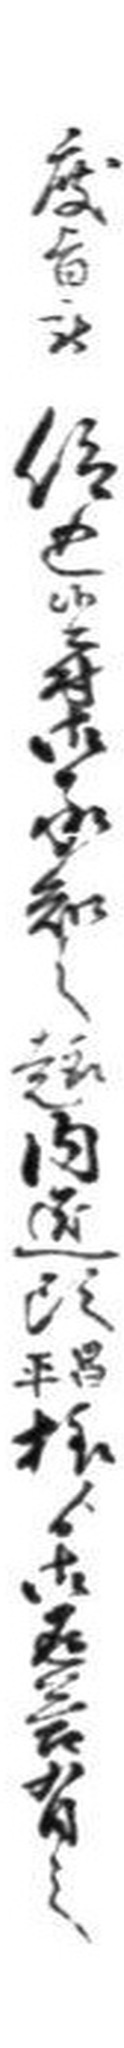度旨被仰込候ニ付御承知之趣内匠頭昌平様ゟ御返答有之
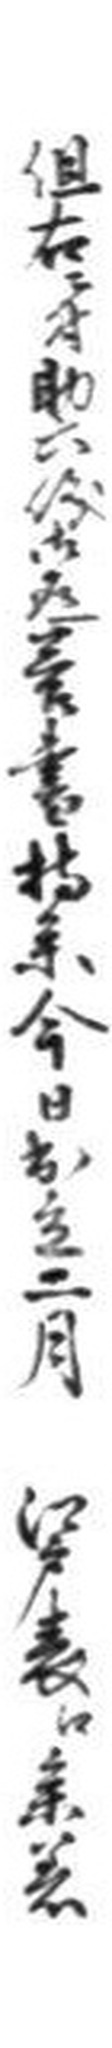但右ニ付助六儀御返答書持参今日出立二月江戸表江参着
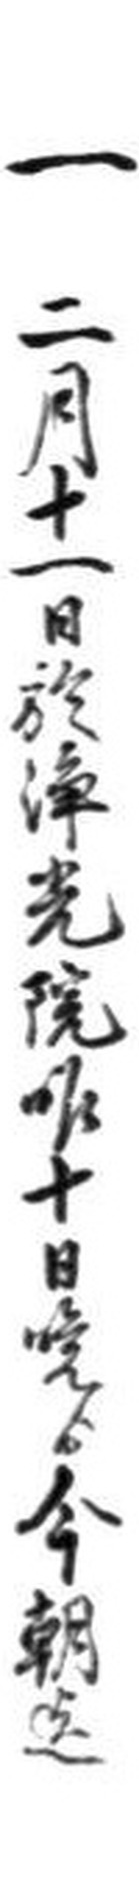一二月十一日於浄光院昨十日暁ゟ今朝迄
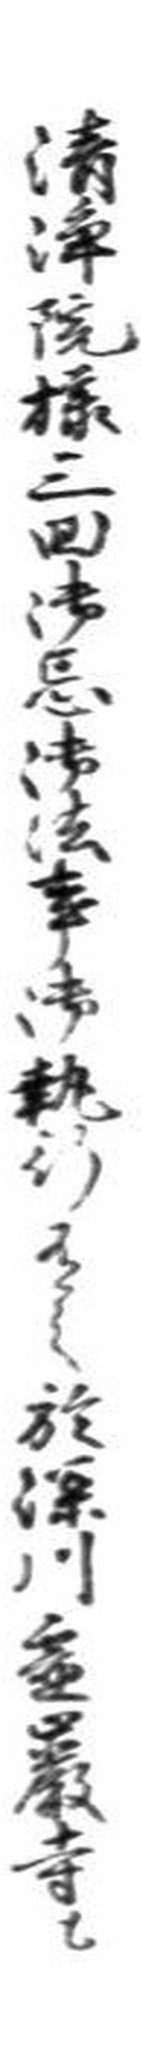清浄院様三回御忌御法事御執行有之於深川霊巖寺も
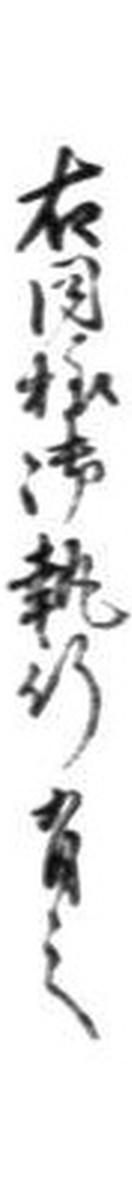右同様御執行有之
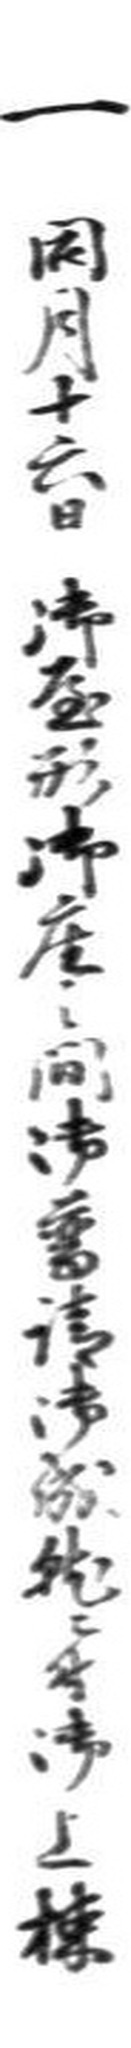一同月十六日御屋形御座之間御普請御成就ニ付御上棟
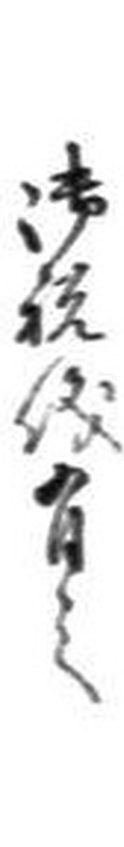御祝儀有之
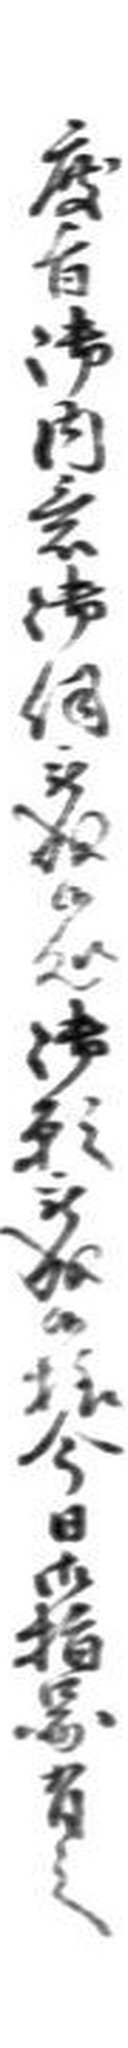度旨御内意御伺被成候処御願被成候様今日御指図有之
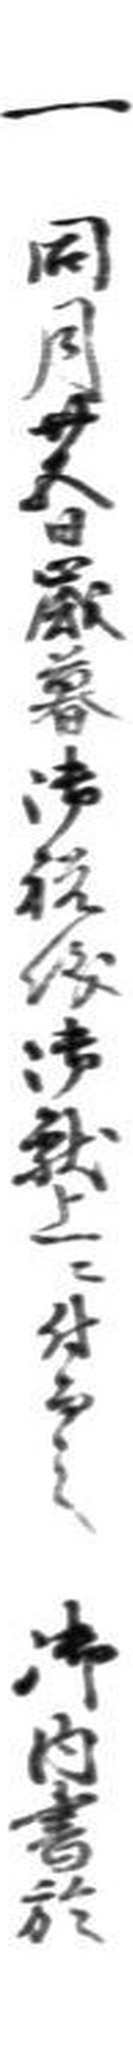一同月廿五日歳暮御祝儀御献上二付而之御内緒於

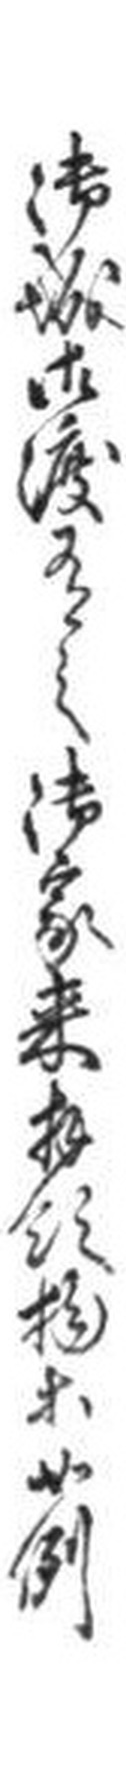御城御渡有之御家来拝領物等如例
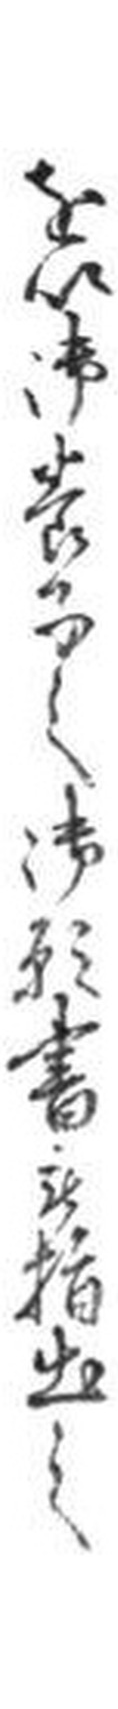を以御養子之御願書被指出之
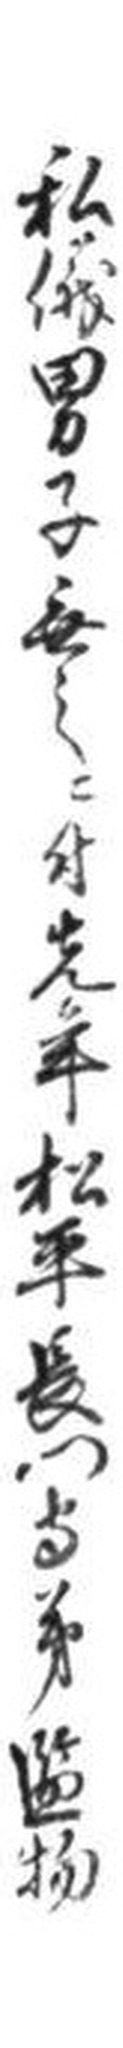私儀男子無之ニ付先年松平長門守弟監物
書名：家譜 二十一 吉品公 従元禄十三年到同十四年
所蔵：福井県文書館 Fukui Prefectural Archives
